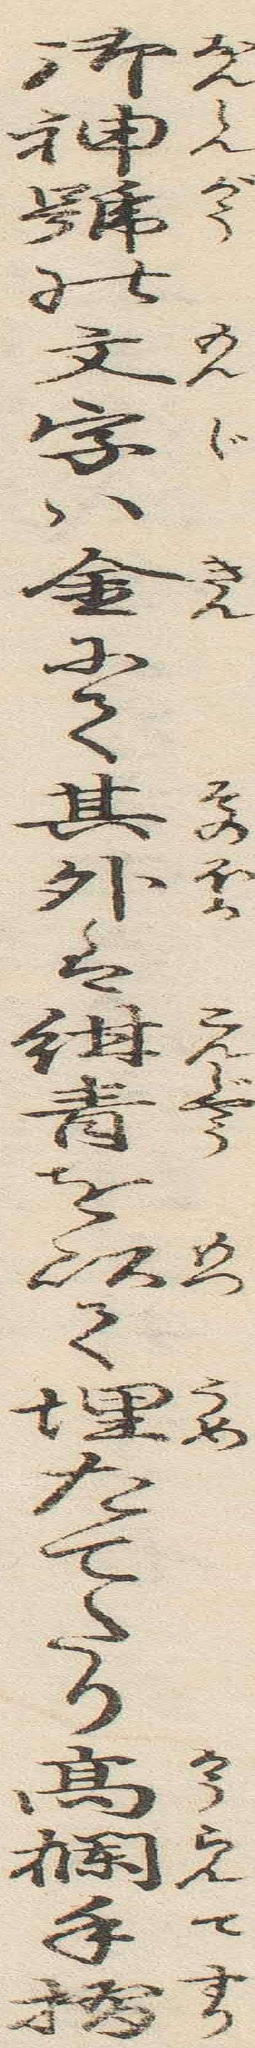御神號の文字は金にて其外は紺青を以て埋たてたり髙欄手摺
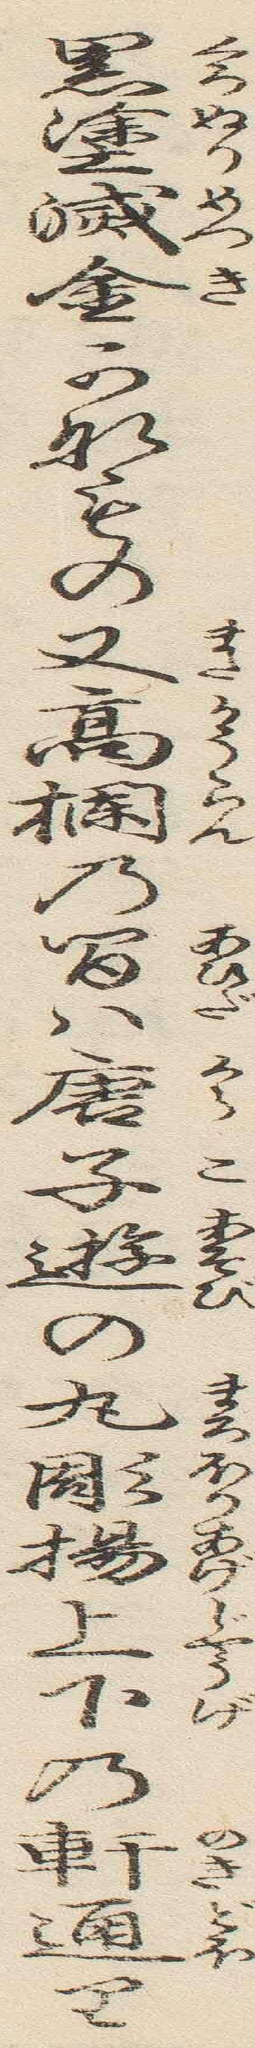黒塗滅金かなもの又髙欄の間は唐子逰の丸彫揚上下の軒通り
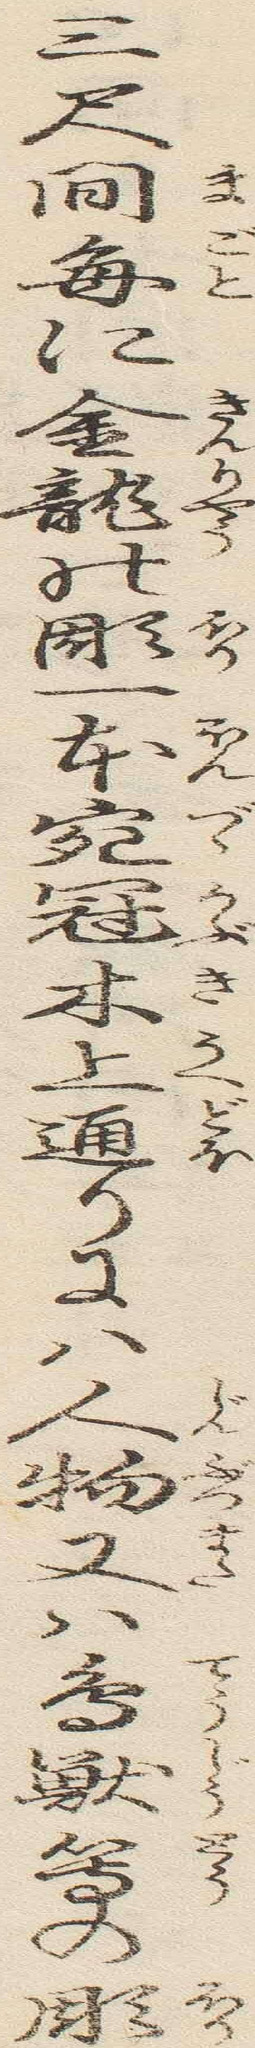三尺間每に金龍の彫一本宛冠木上通りには人物又は鳥獣等の彫
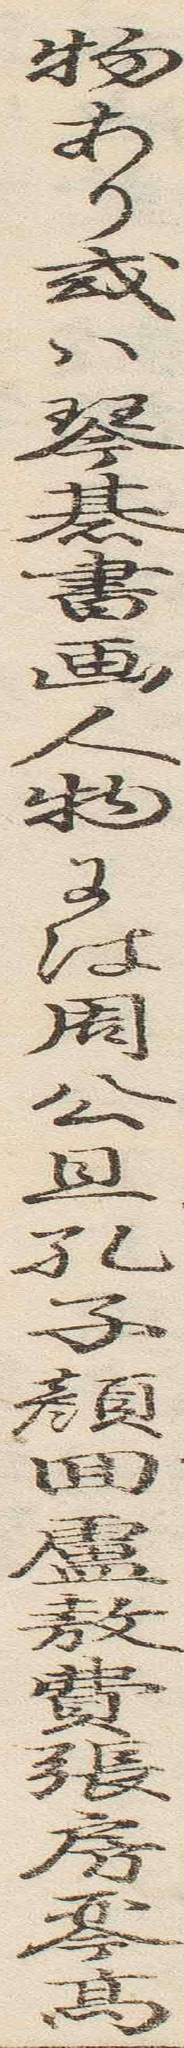物あり或は琴碁書画人物には周公旦孔子顏囬盧敖費張房琴髙
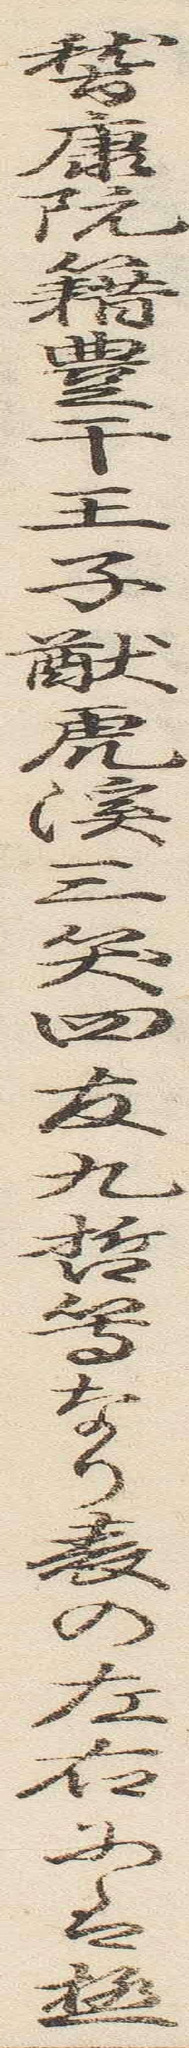稽康阮籍豊干王子猷虎溪三笑四友九哲等なり表の左右には極
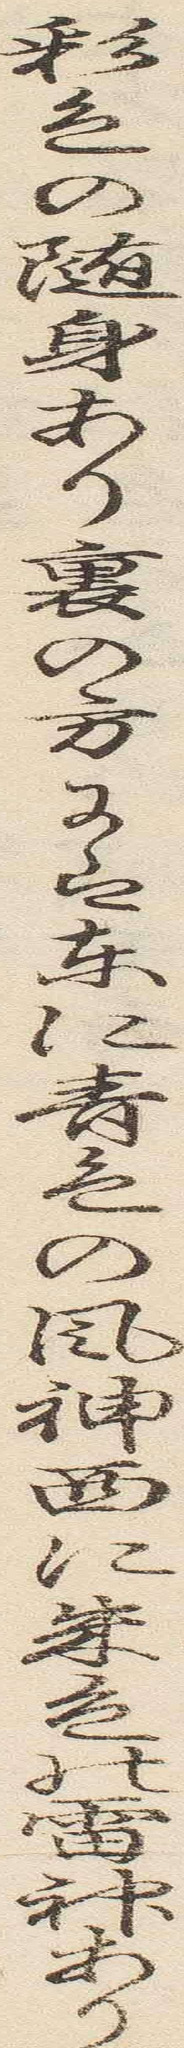彩色の随身あり裏の方には東に青色の風神西に朱色の雷神あり
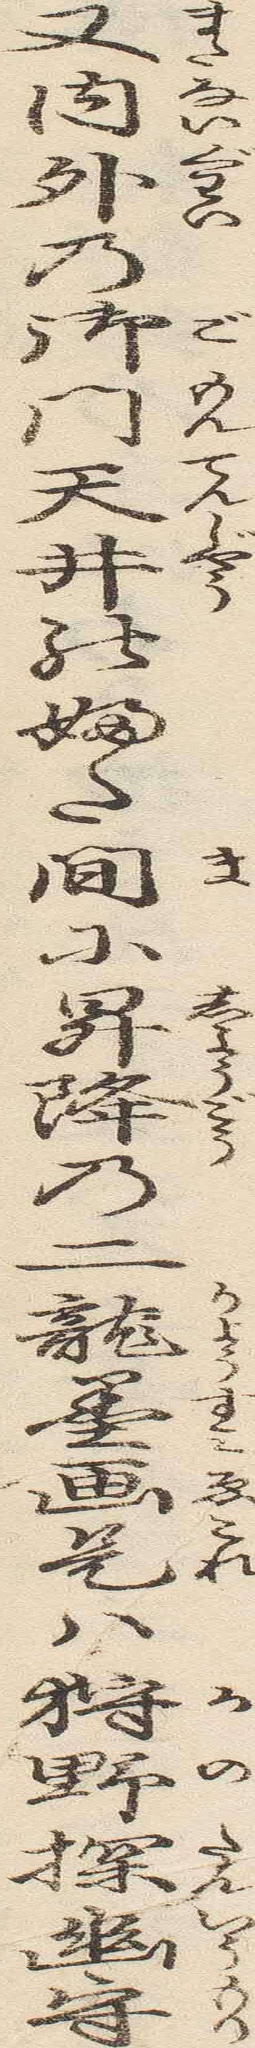又内外の御門天井のふた間に昇降の二龍墨画是は狩野探幽守
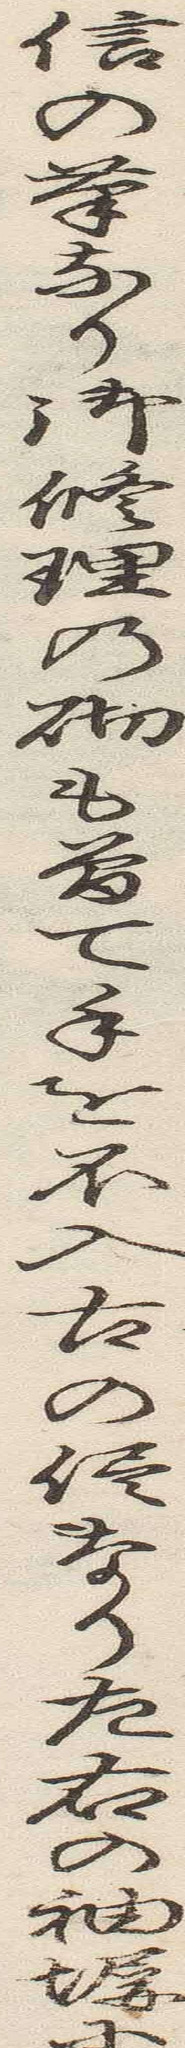信の筆なり御修理の砌も曽て手を不入古の侭なり左右の袖塀に
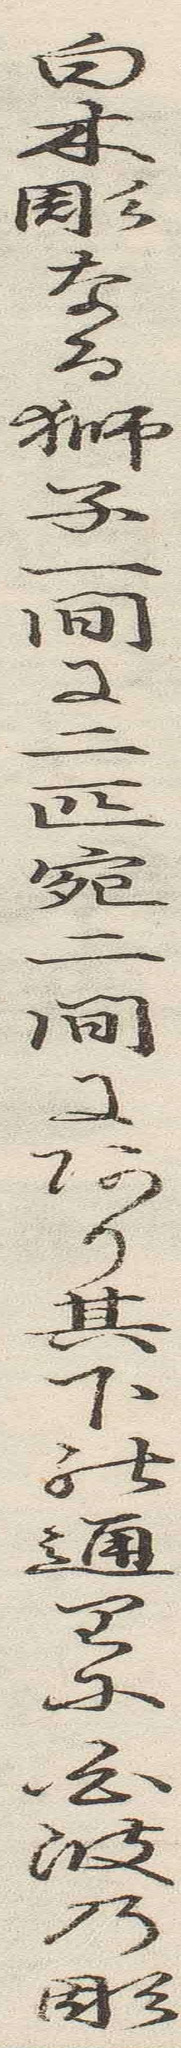白木彫なる獅子一間に二匹宛二間にあり其下の通りに白波の彫
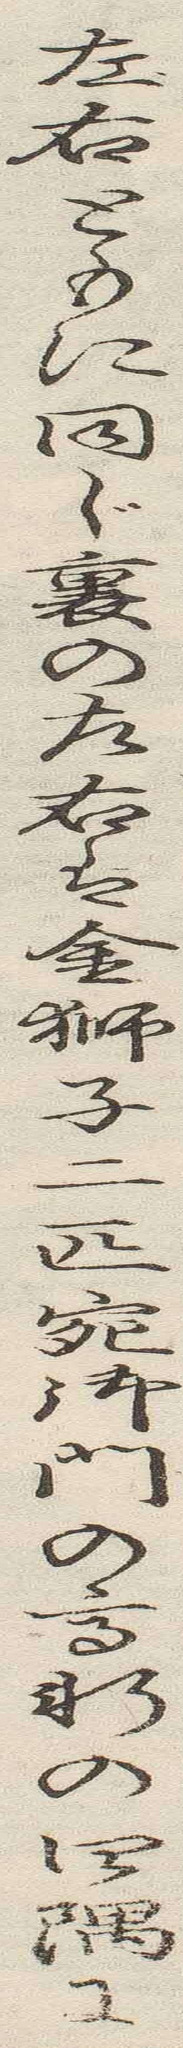左右ともに同じ裏の左右は金獅子二匹宛御門の高軒の四隅に
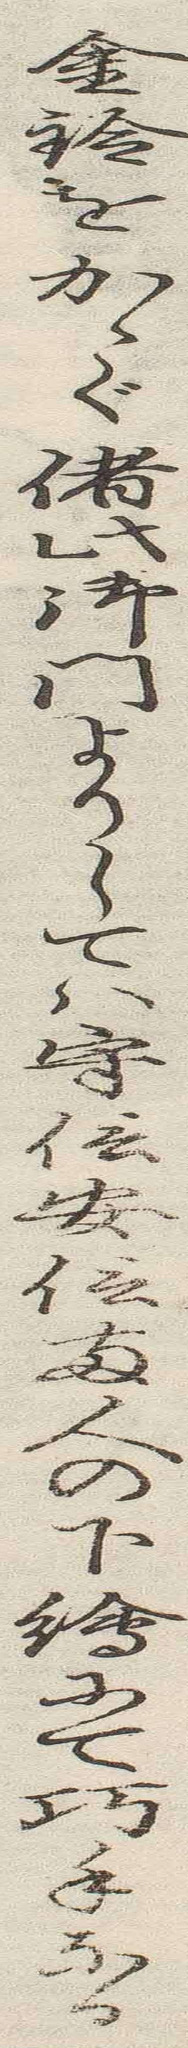金鈴をかゝぐ偖此御門よりしては守信安信両人の下繪にて巧手なる
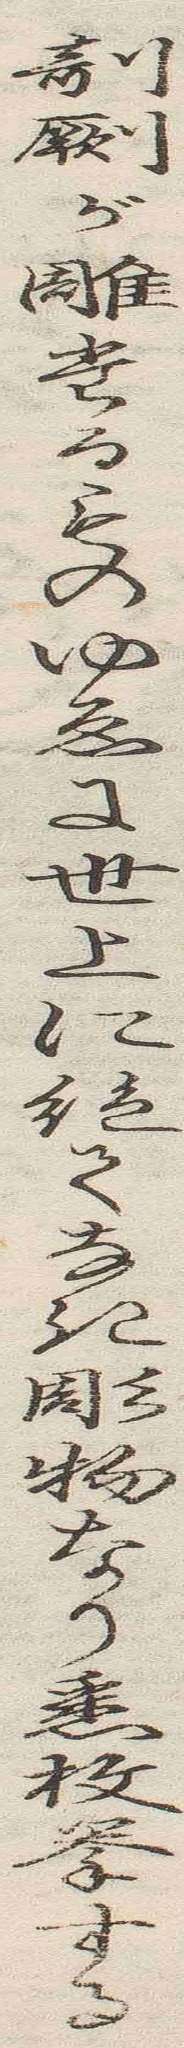剞劂が雕たるものゆゑに世上に絶てなき彫物なり悉枚挙する
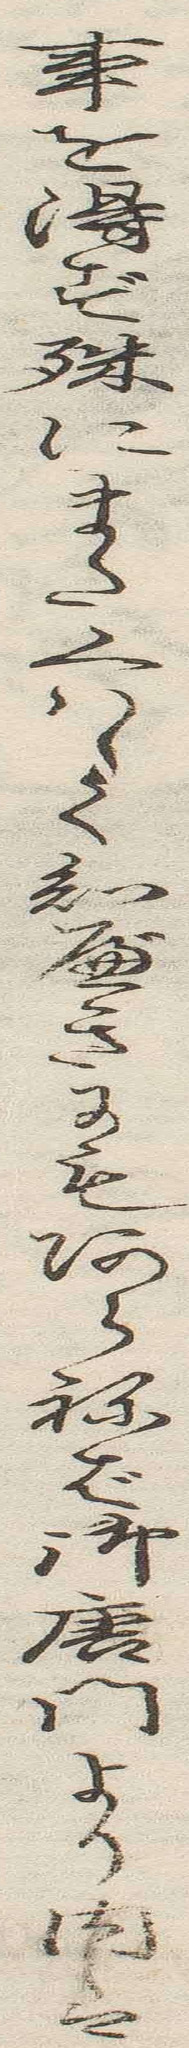事を得ず殊にまたくはしく知べきにもあらねば御唐門より内は
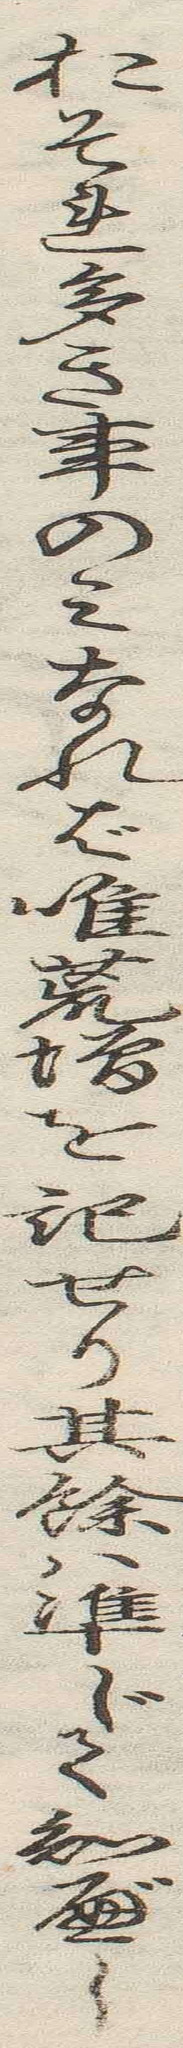おそれ多き事のみなれば唯荒増を記せり其餘は凖じて知べし
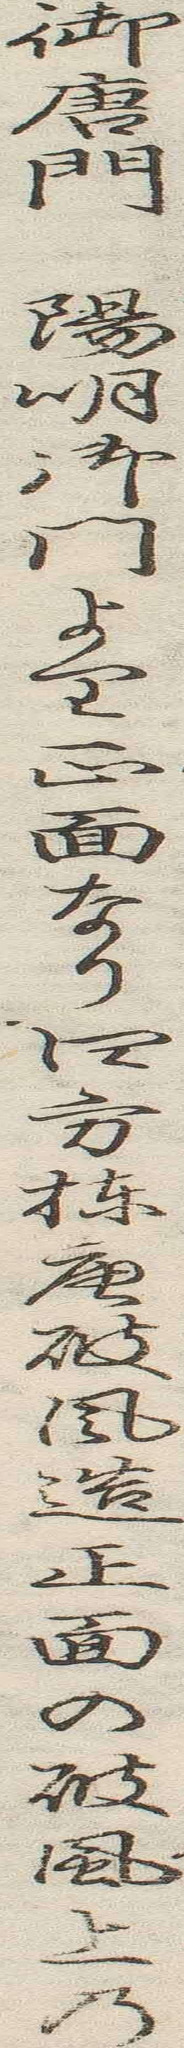御唐門陽明御門より正面なり四方棟唐破風造正面の破風上の
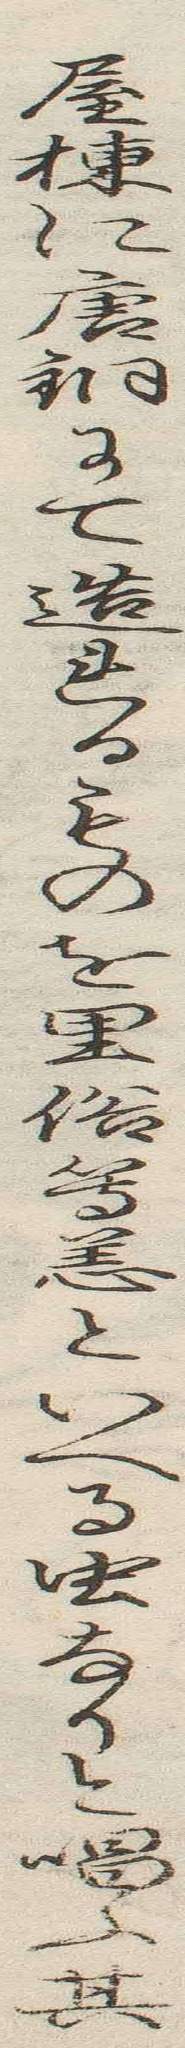屋棟に唐銅にて造れるものを里俗等恙といへる虫なりと唱ふ其
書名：日光山志
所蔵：東京学芸大学附属図書館 国文学研究資料館
